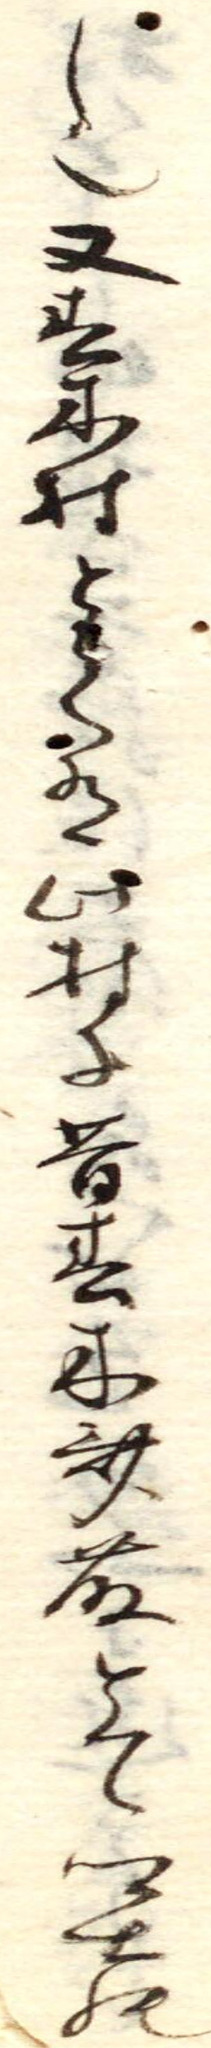し也又春木村とて有この此村に昔春木斎藤とて郷士の
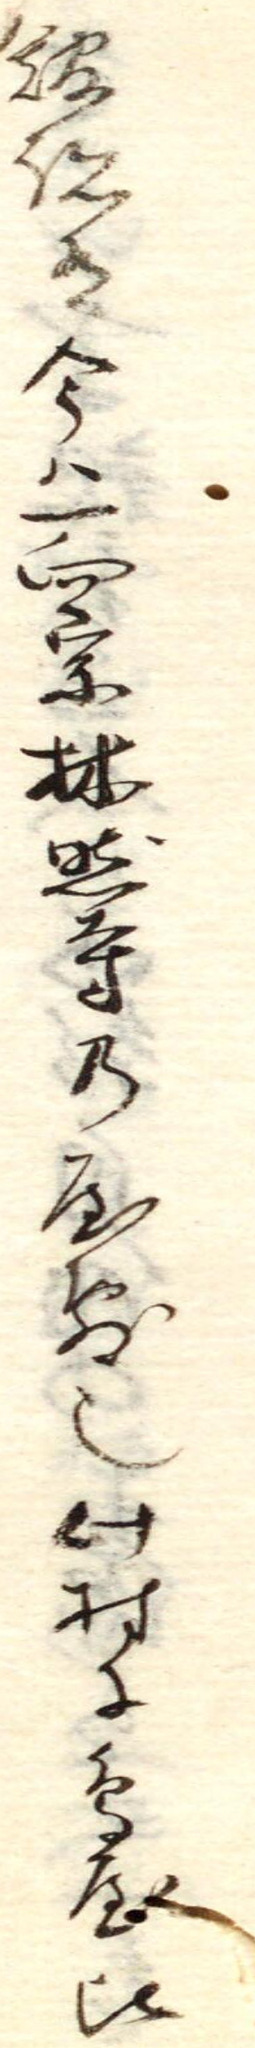館跡有今は一向宗林然寺の屋敷也此村に鳥屋比
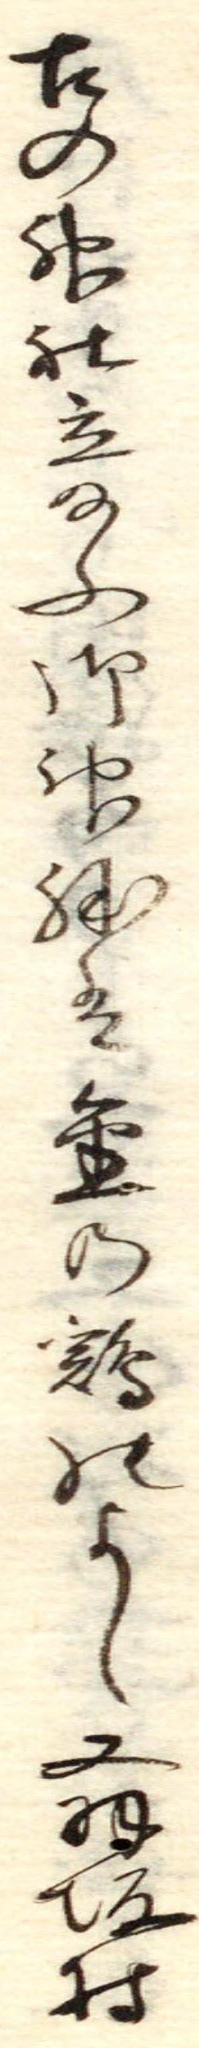古の神社立給ふ御神躰は金の鶏のよし又羽坂村
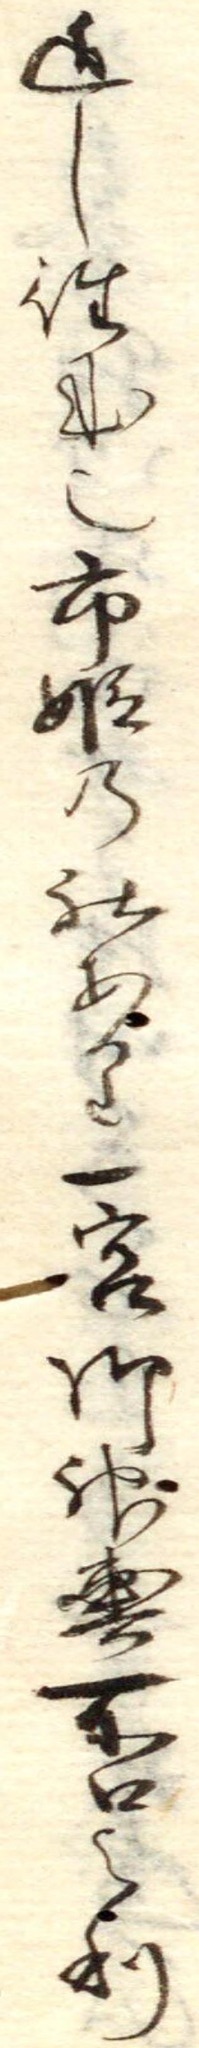近し往来也市姫の社あり一宮御神輿所口より
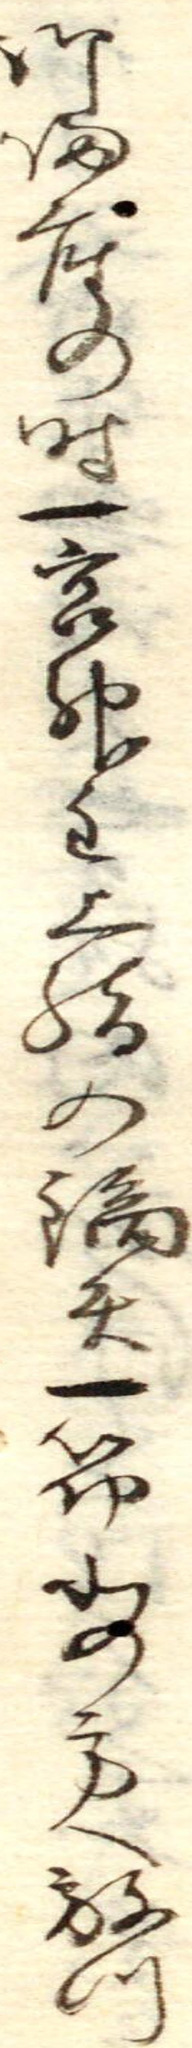御帰座の時一宮神主上指の鏑矢一筋北の方へ放つ

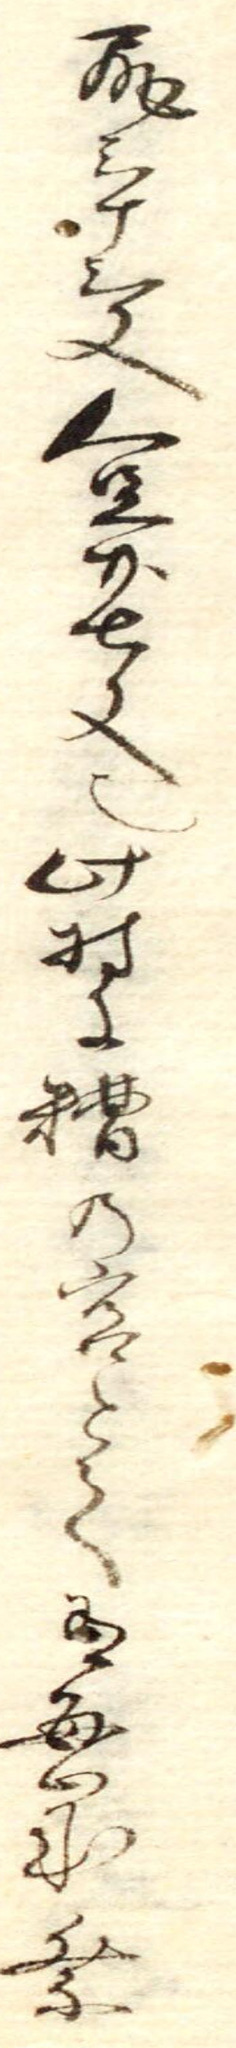尻三十三文人足廿七文也此村に糟の宮とて有毎歳祭
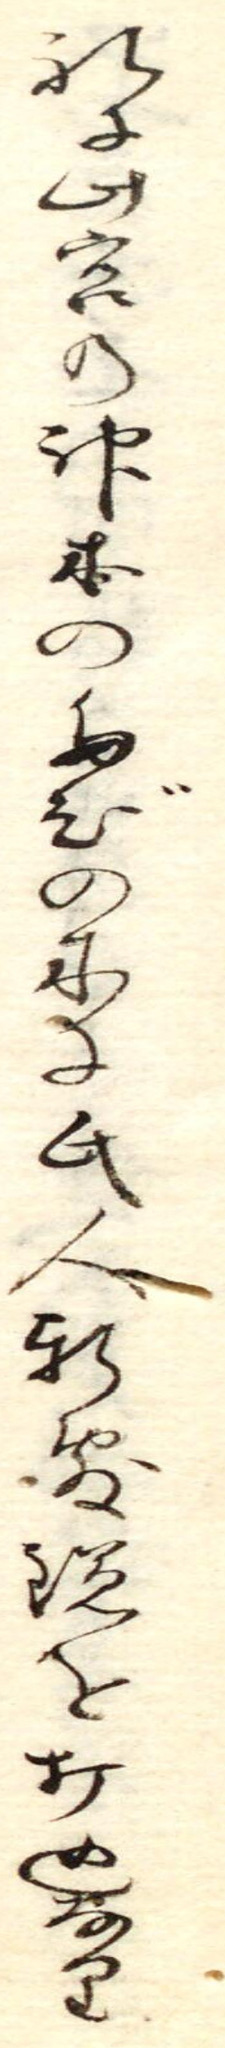礼に此宮の神木のたびの木に氏人新敷鎌を打込なり
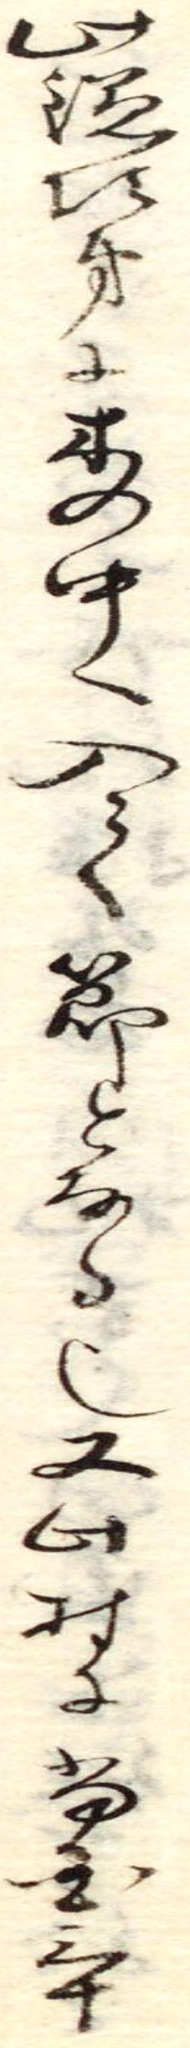此鎌次第に木の中へ入て節となる也又此村に当国三十
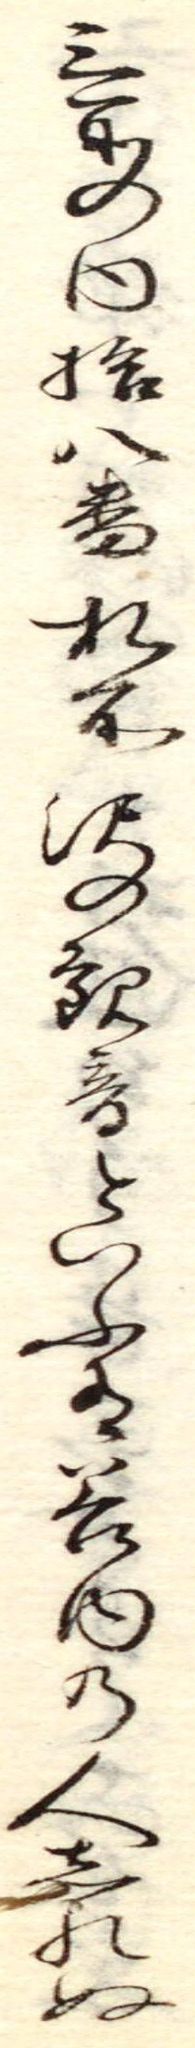三所の内拾八番札所沢の観音といふ有谷内の人しれぬ
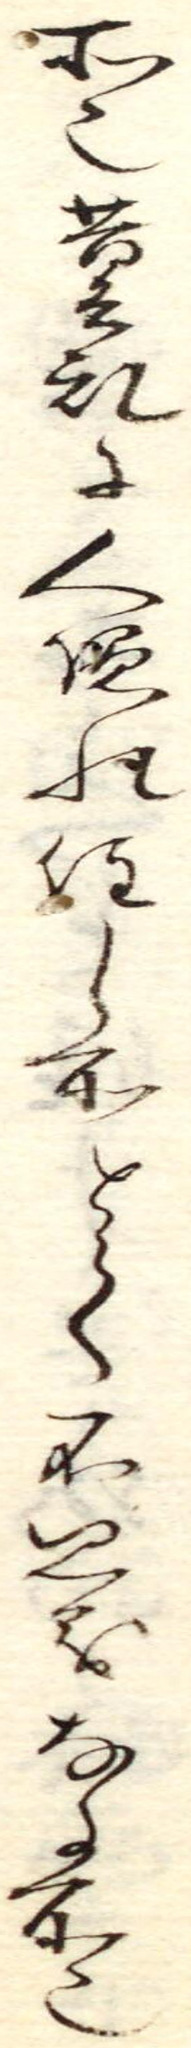所也昔兵乱に人隠れ住し所とて不思議なる所也
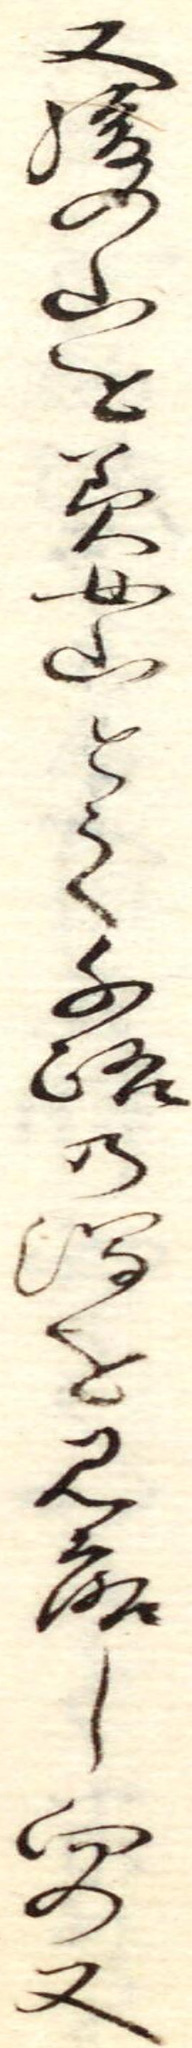又後の山を美女山とて千路の潟を見落し向の又
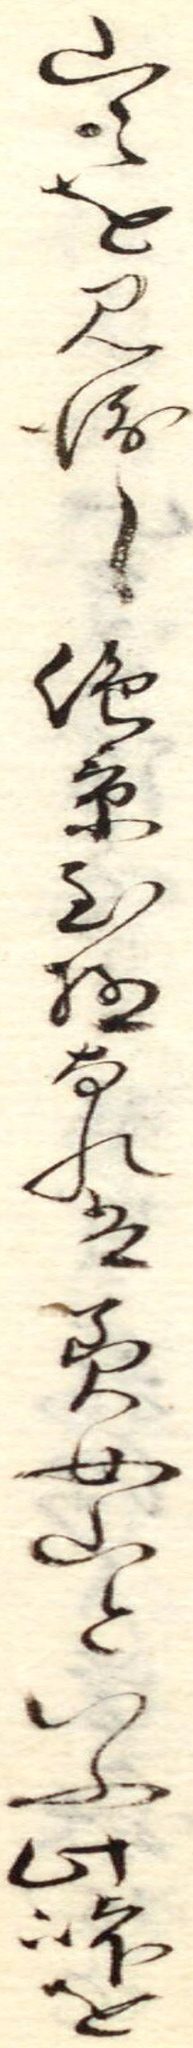山々を見渡絶景至極なれは美女山とうふ此峠を
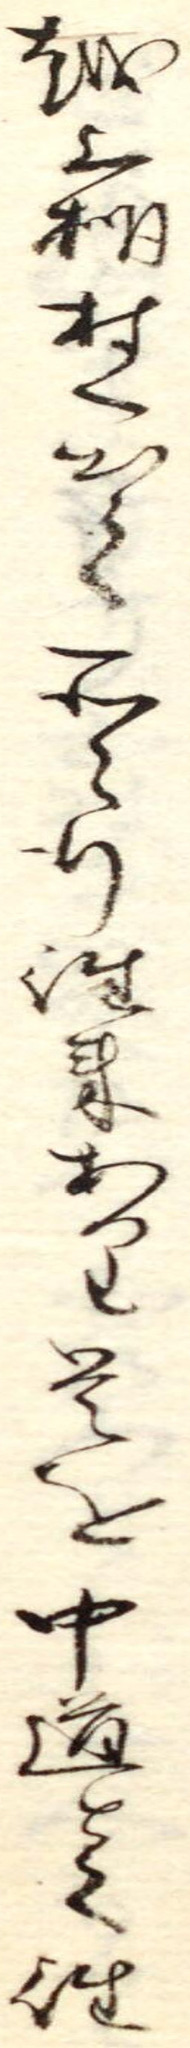越上棚村へ出て諸所々行往来あり是を中道とて往
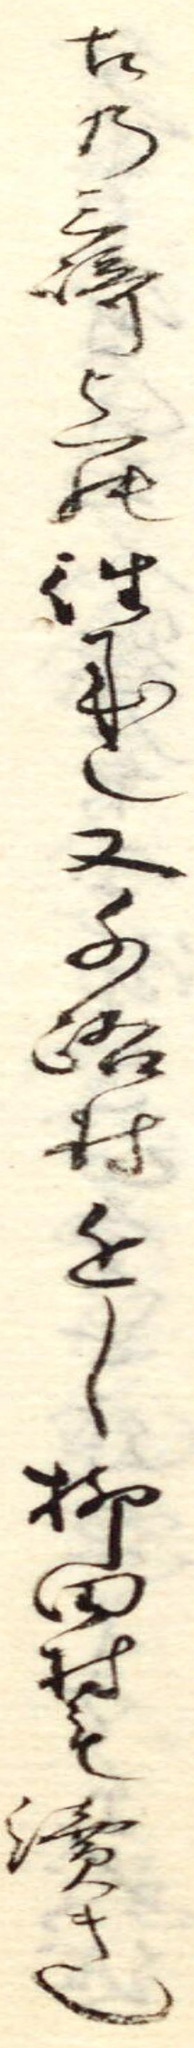古の三崎迄の往来也又千路村近し柳田村も続き也
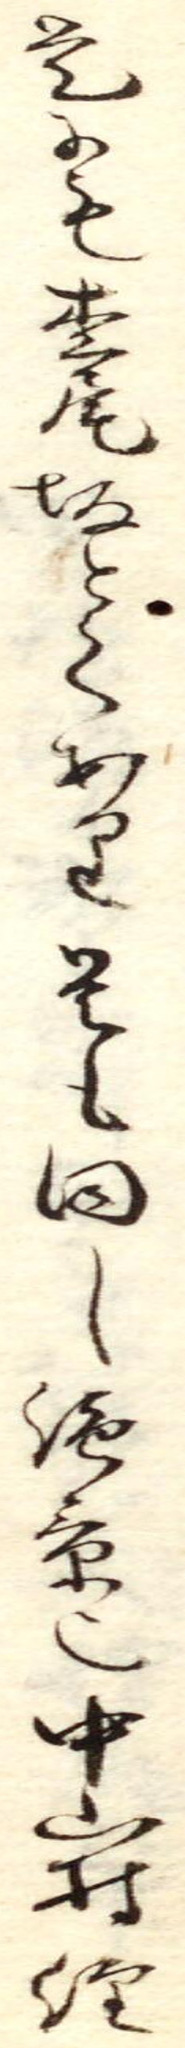是にも杢尾坂とてあり是も同じ絶景也中山村経
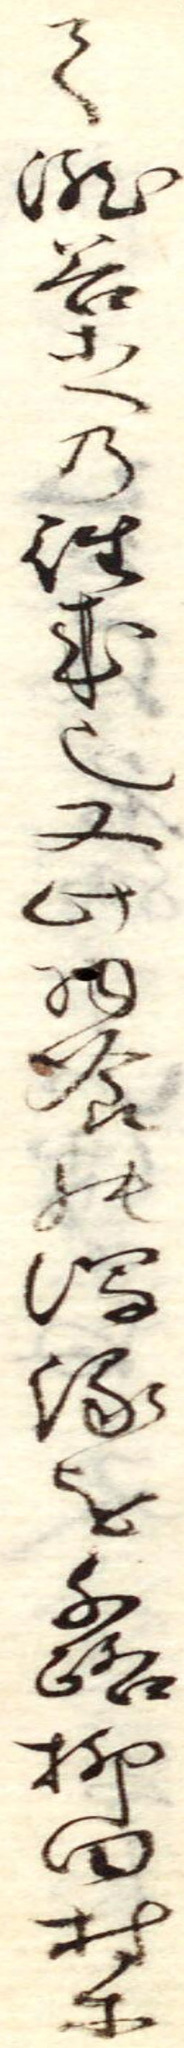て瀧谷等への往来也又此羽喰の潟縁を千路柳田村等
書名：能登名跡誌
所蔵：Ishikawa Prefectural Library
